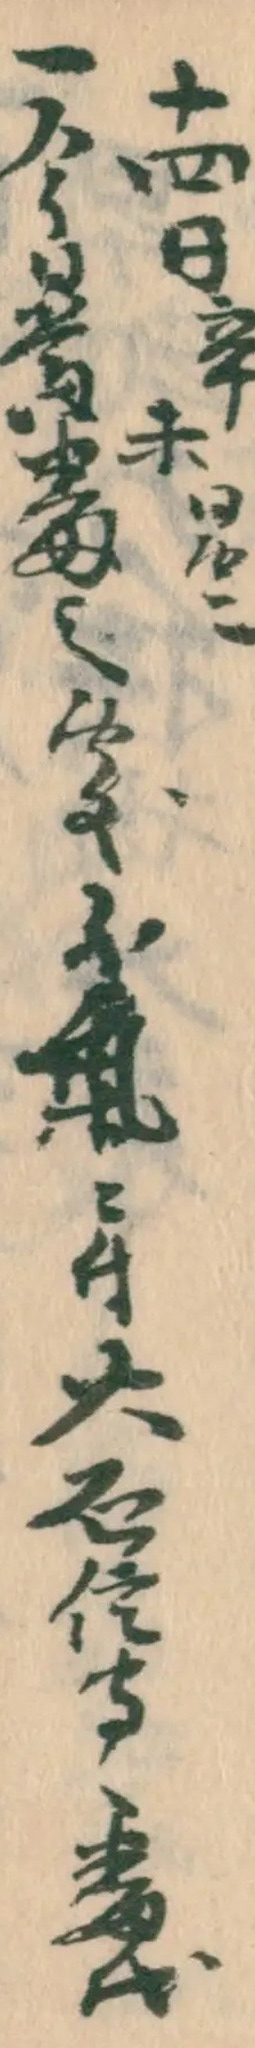一今日当番之処不ニ付大石信守へ番代
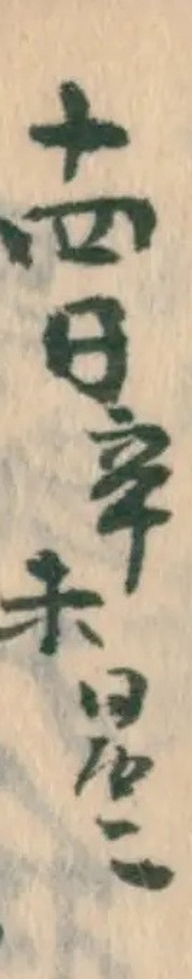十四日辛未曇
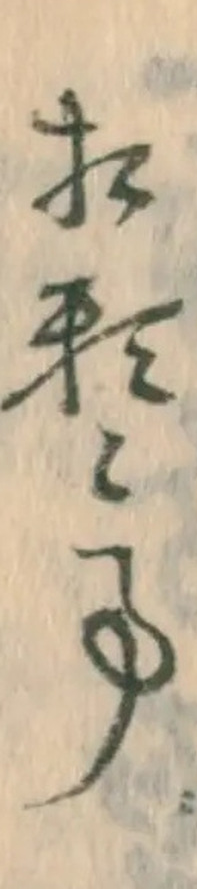相頼候事
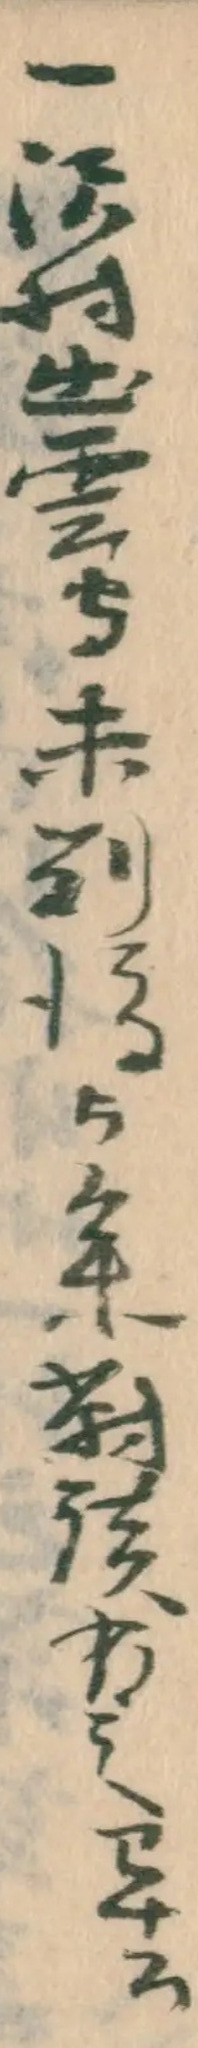一沢村出雲守未刻後被参対談有之畢而
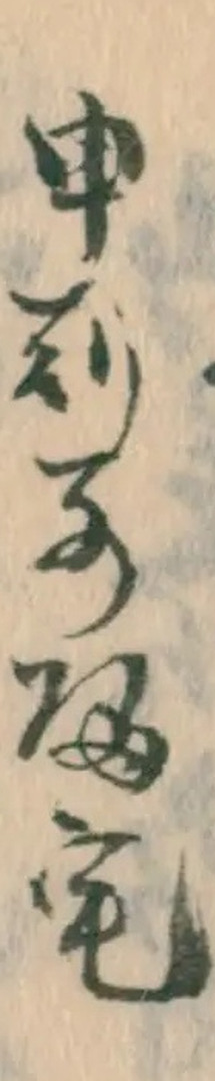申刻前帰宅
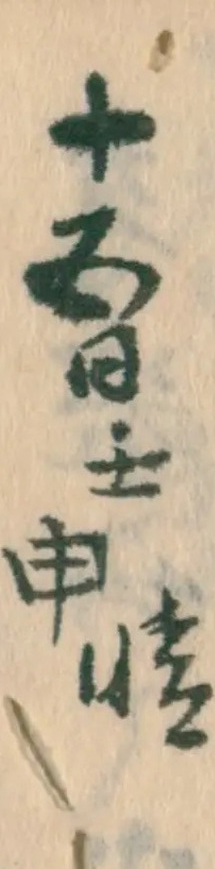十五日壬申晴
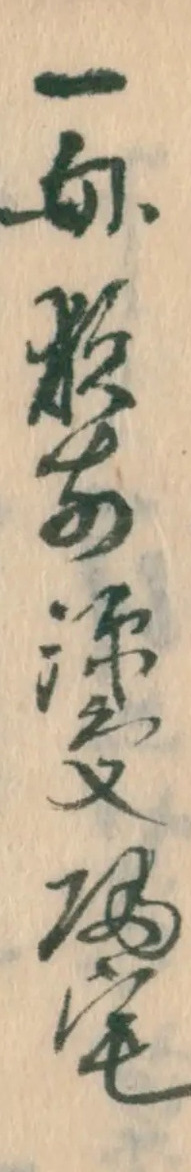一母夜前深更帰宅
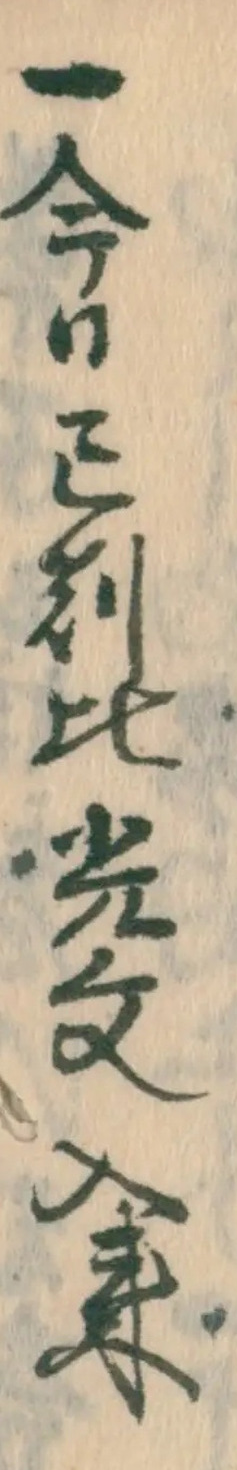一今日巳刻頃光文入来
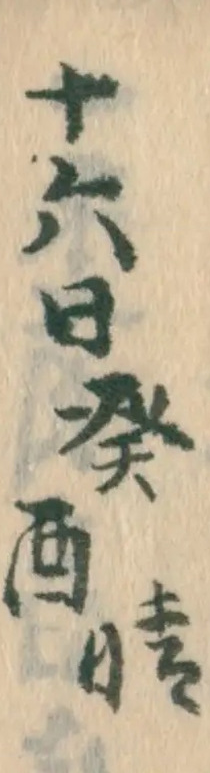十六日癸酉晴

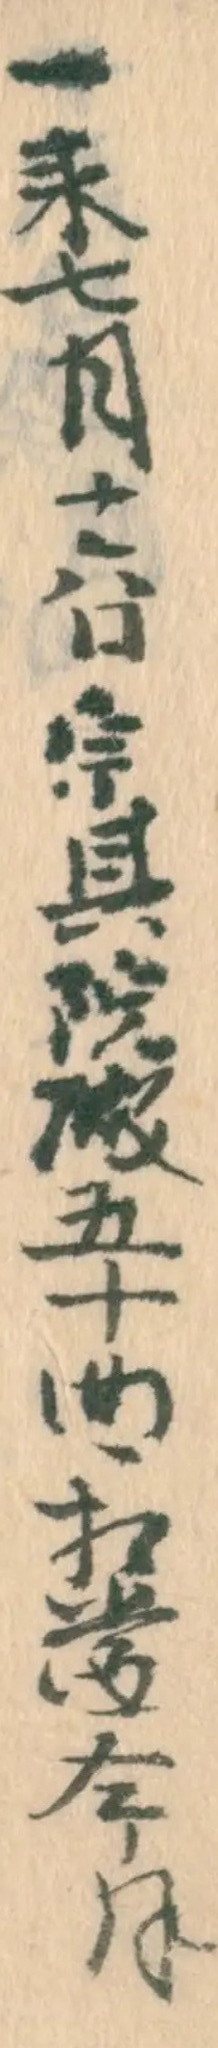一来七月十六日宗具院殿五十回相当今月
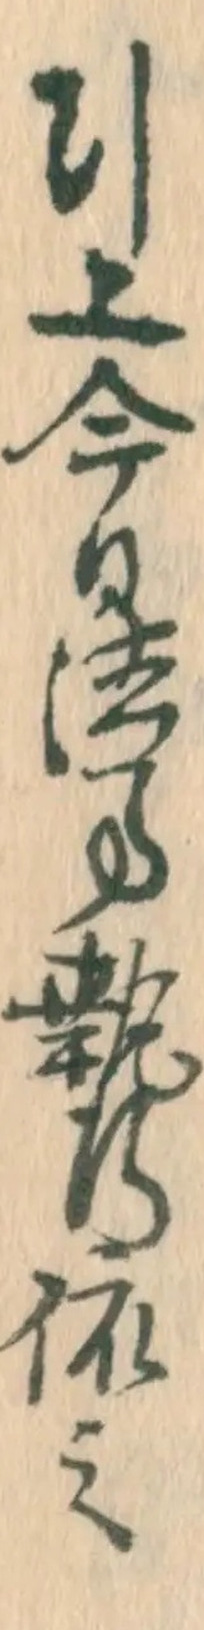引上今日法事執行依之
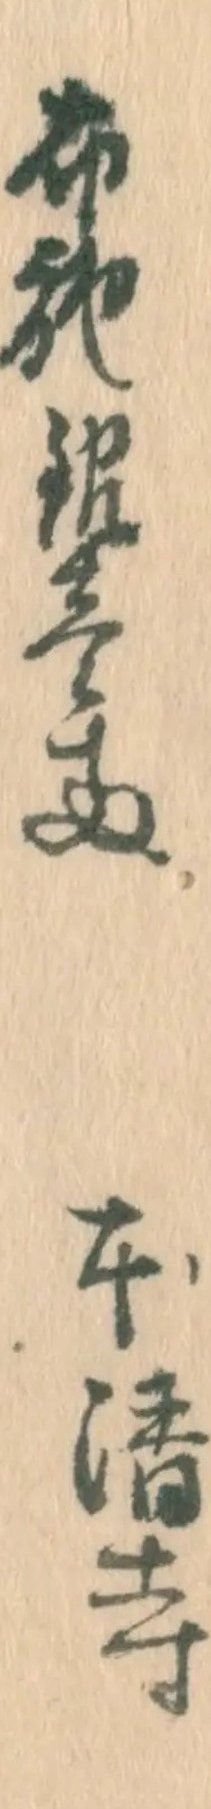布施銀壱両本清寺
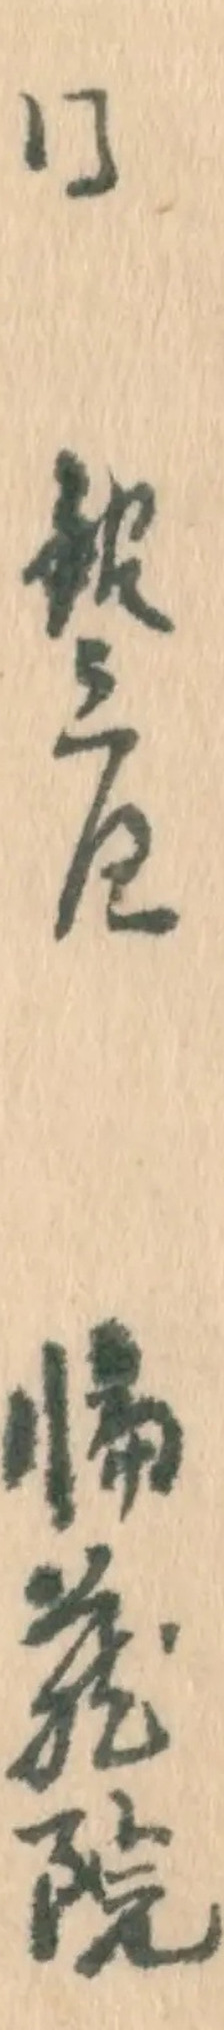同銀三匁輪蔵院
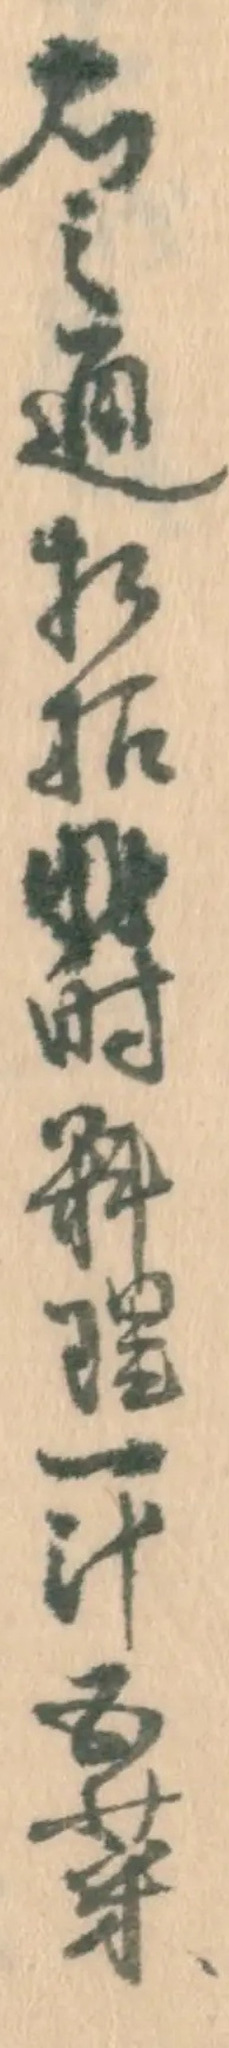右之通相招非時料理一汁五菜
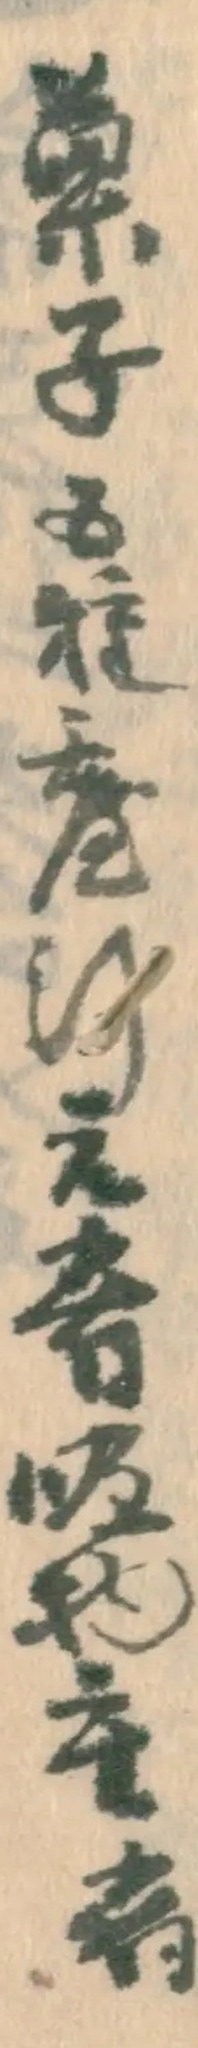菓子五種台引取肴吸物重肴
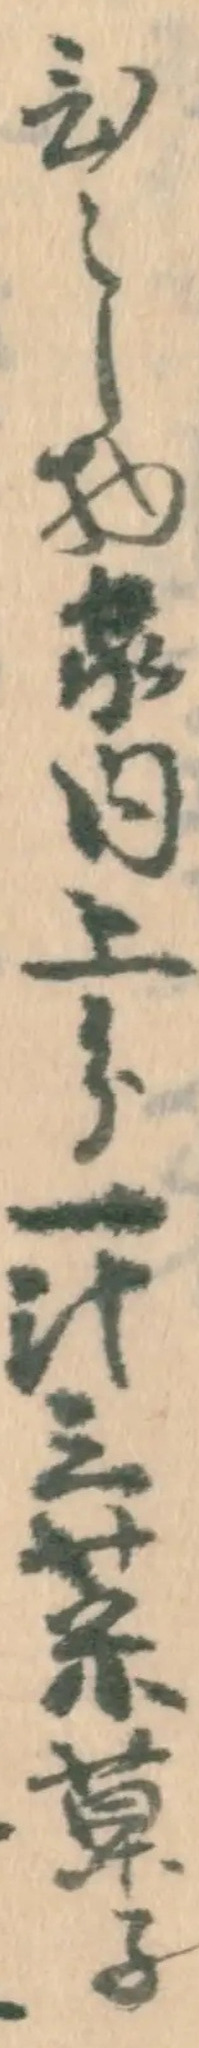ひたし物家内上分一汁三菜菓子
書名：禁裏御所御用日記. [131]
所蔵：国立国会図書館 National Diet Library, JAPAN
